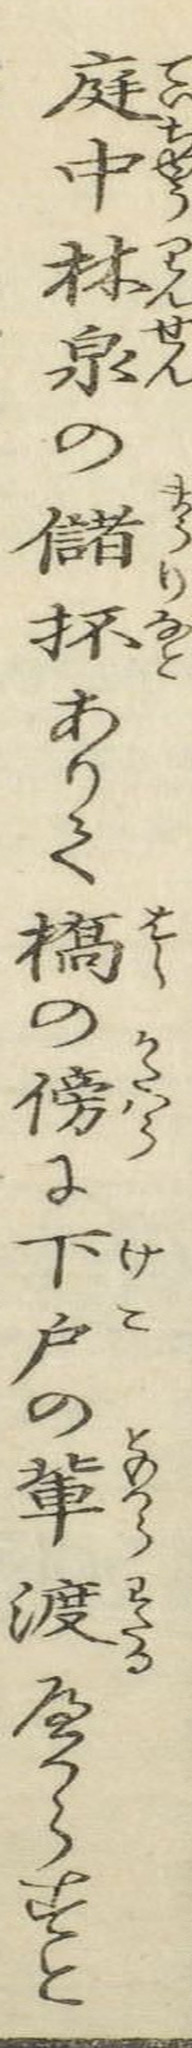庭中林泉の儲抔ありて橋の傍に下戸の輩渡へからすと
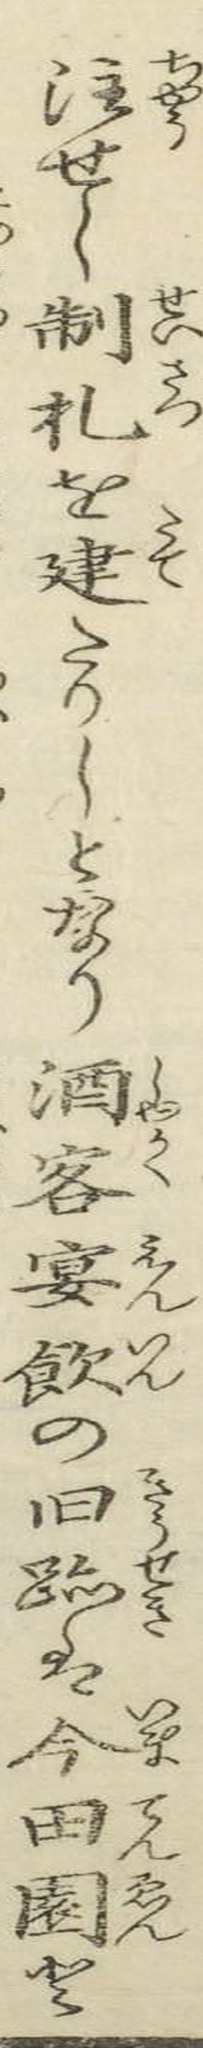注せし制札を建たりしとなり酒客宴飲の旧跡は今田園と
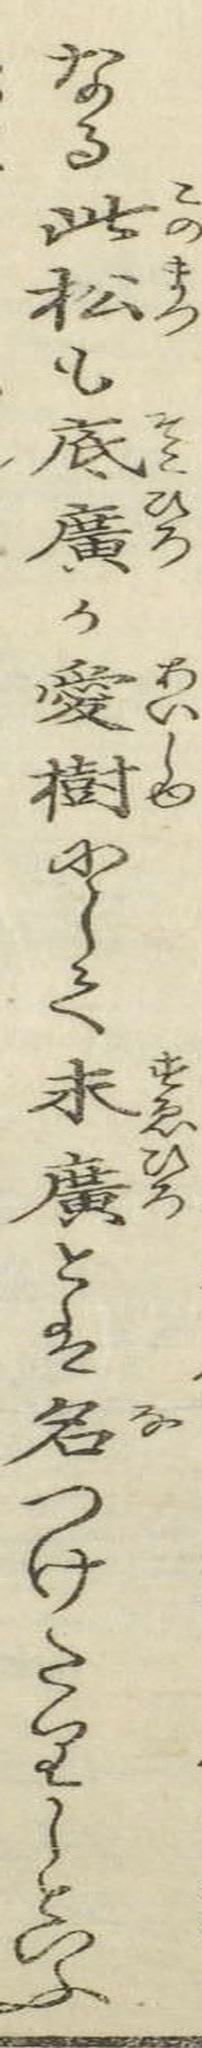なる此松も底廣か愛樹にして末廣とは名つけたりしといふ
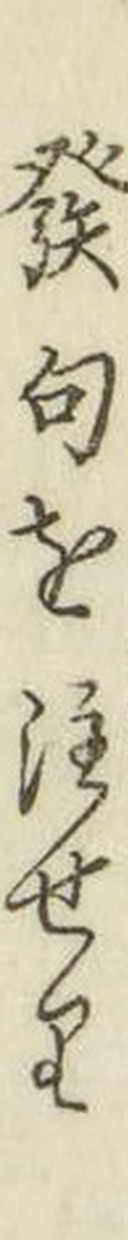發句を注せり
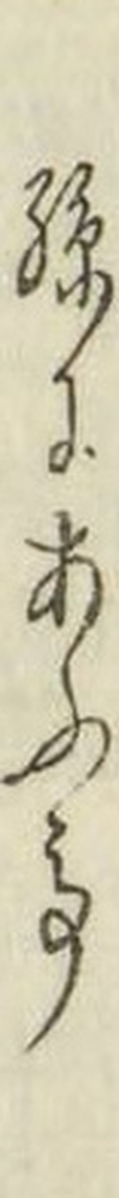孫にあふ事
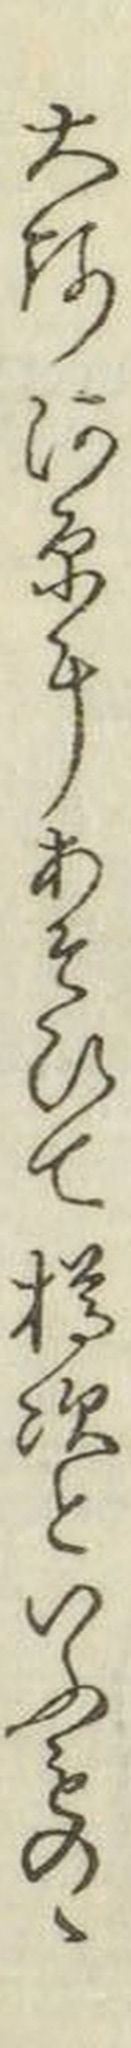大師河原にあそひて樽次といふものゝ
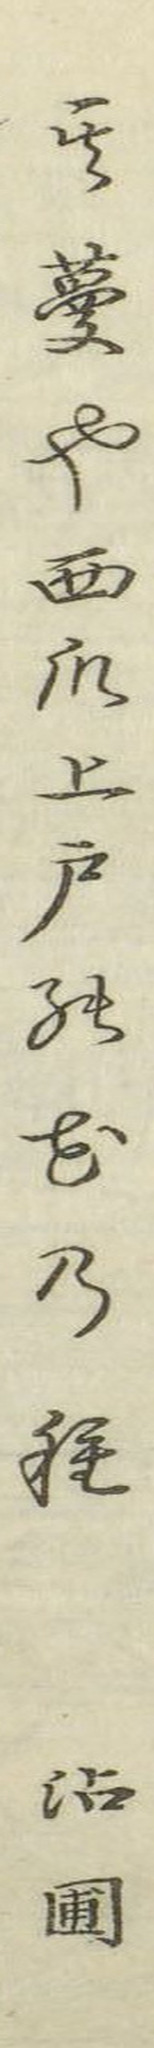其蔓や西瓜上戸の花の種沾圃
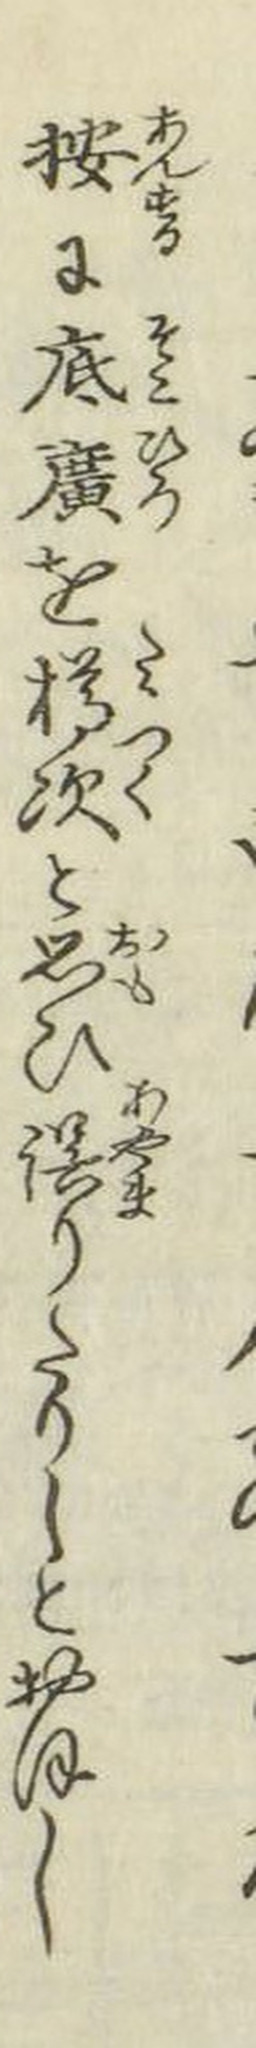按に底廣を樽次と思ひ誤りたりしとおほし
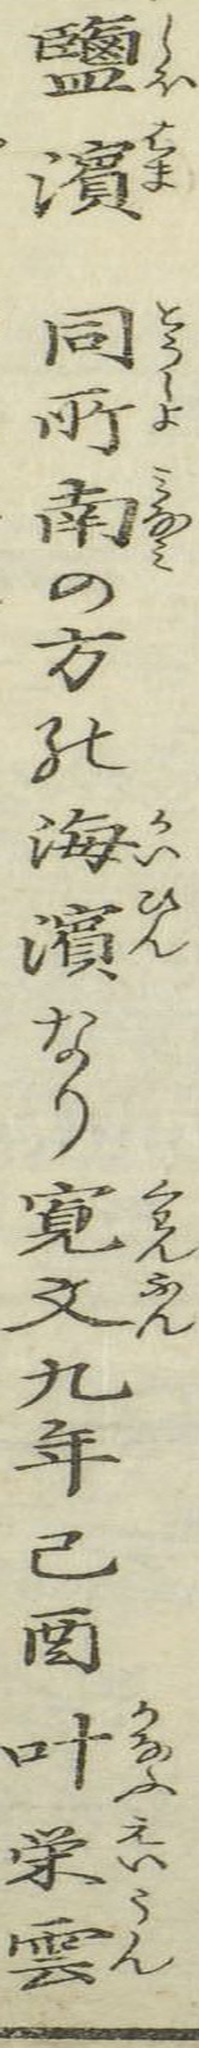鹽濵同所南の方の海濵なり寛文九年己酉叶栄雲
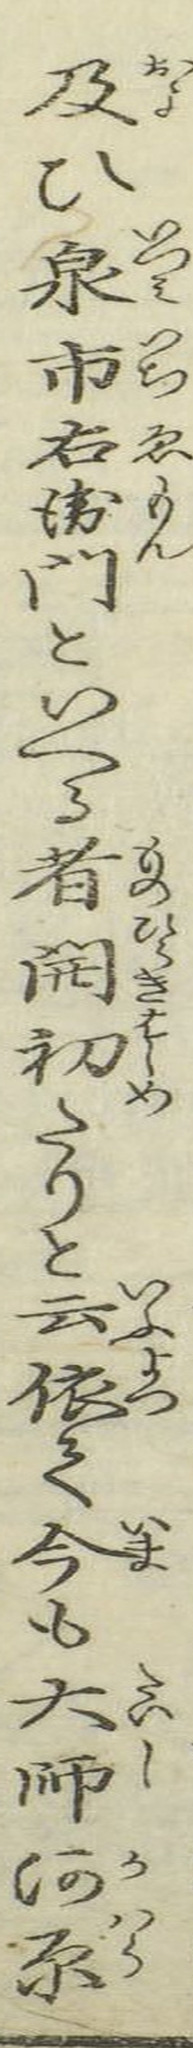及ひ泉市右衛門といへる者開初たりと云依て今も大師河原
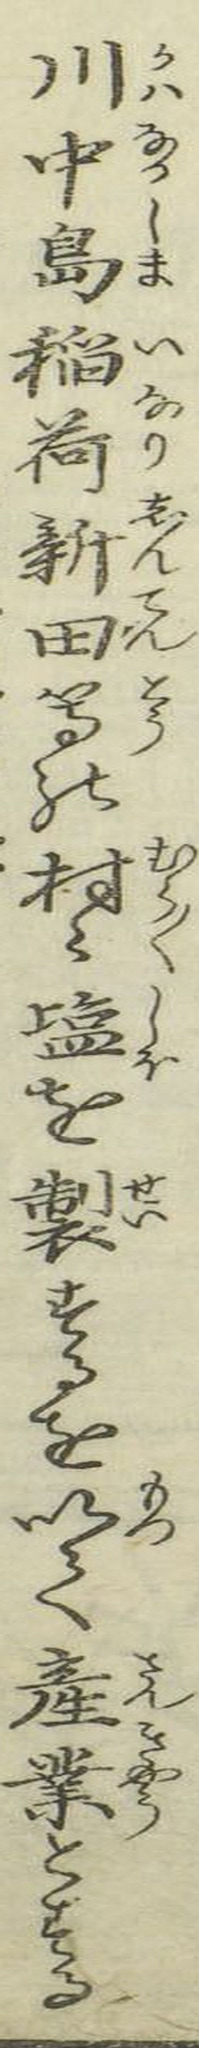川中島稲荷新田等の村々塩を製するを以て産業とする
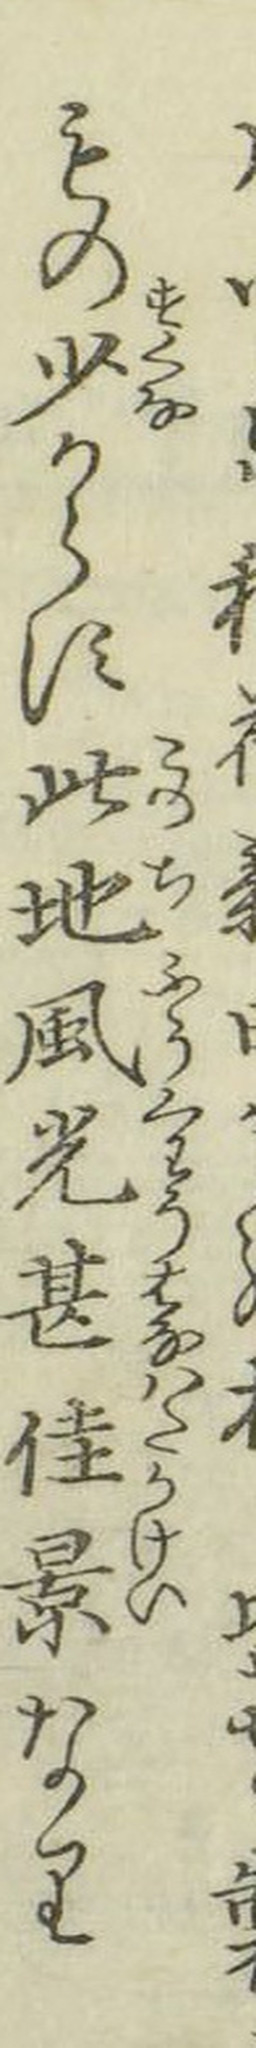もの少からす此地風光甚佳景なり

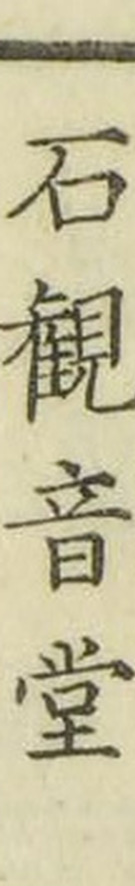石観音堂
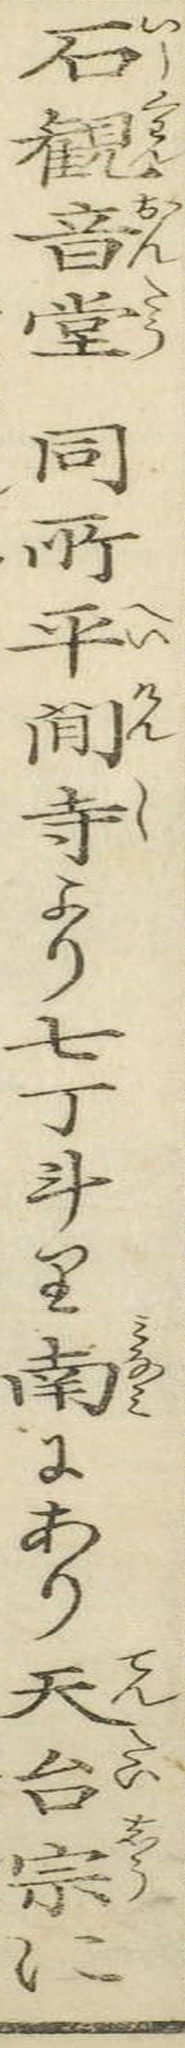石観音堂同所平間寺より七丁斗南にあり天台宗に
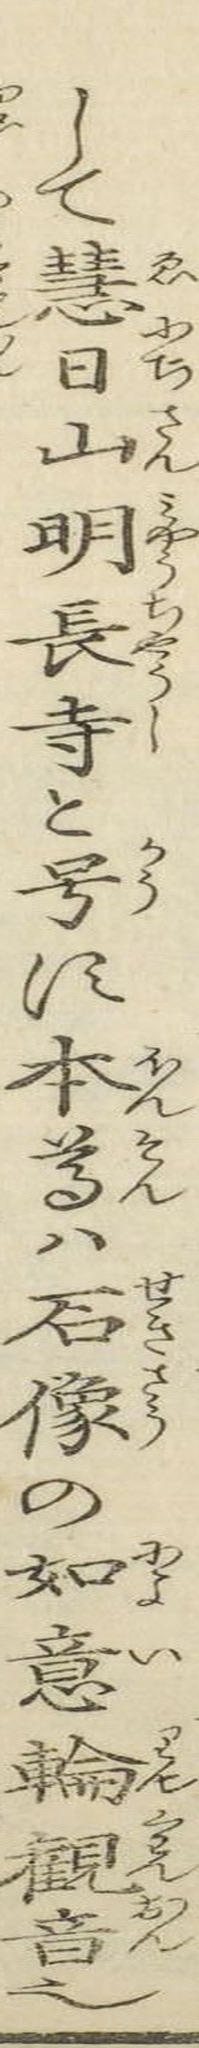して慧日山明長寺と号す本尊は石像の如意輪観音也
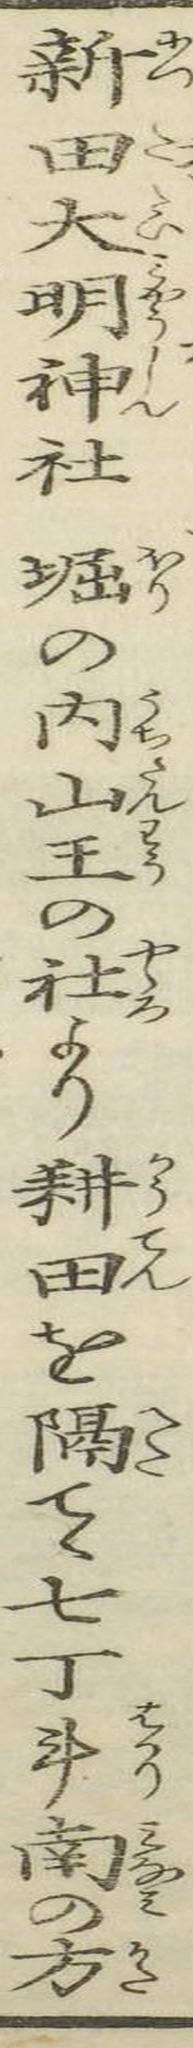新田大明神社堀の内山王の社より耕田を隔てゝ七丁斗南の方
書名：江戸名所図会 20巻 巻之5
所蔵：東京学芸大学教育コンテンツアーカイブ
